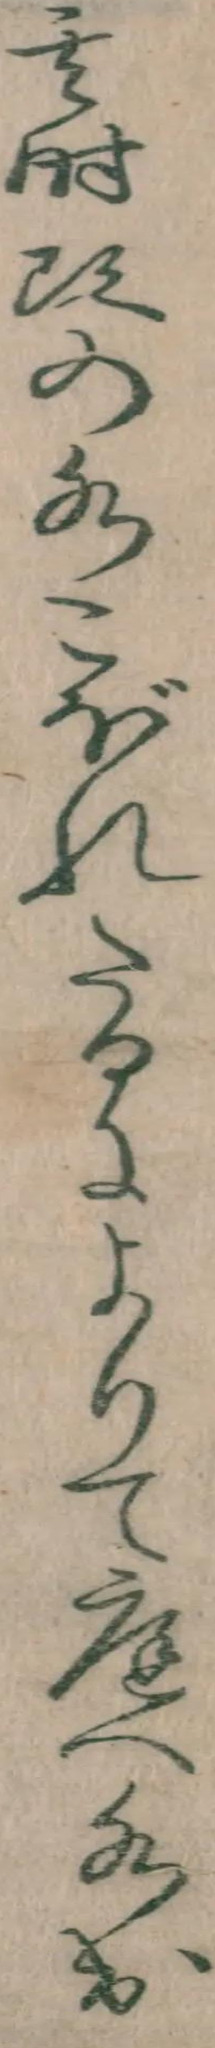其時頭の水こぼれたるによりて庭へ水出
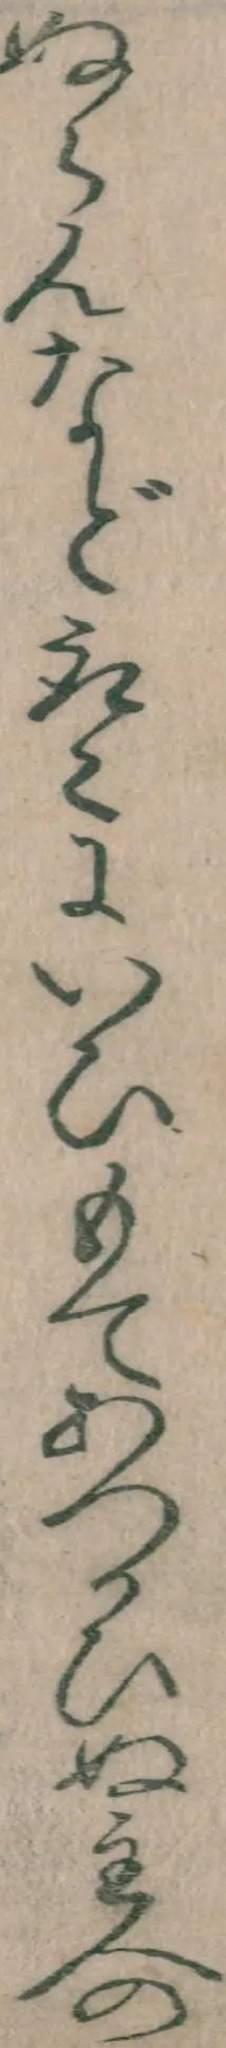ぬらんなど取々にいひもてあつかひぬ主人の
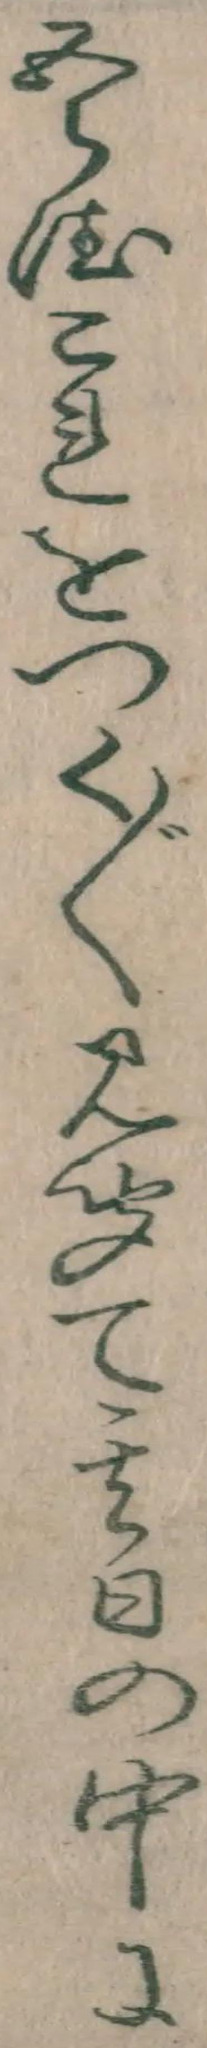五郎徳これをつく〴〵見聞て其日の中に
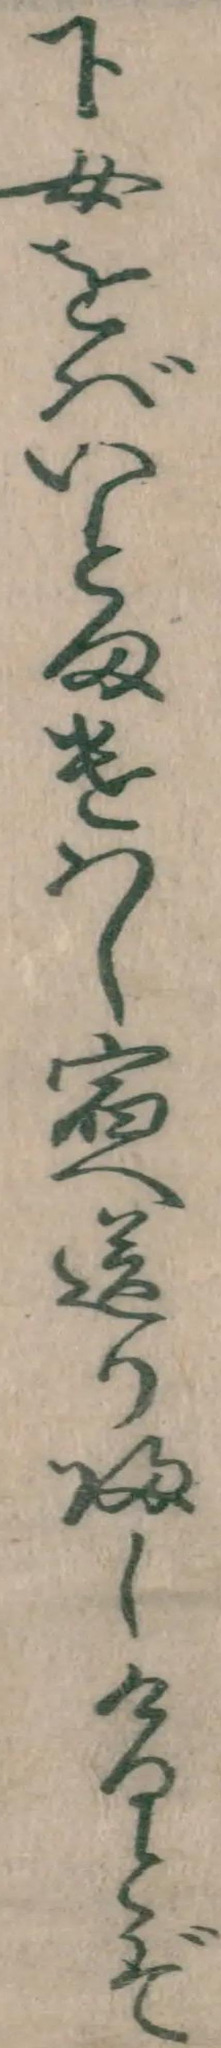下女をばいとま遣はし宿へ送り帰しけるとぞ
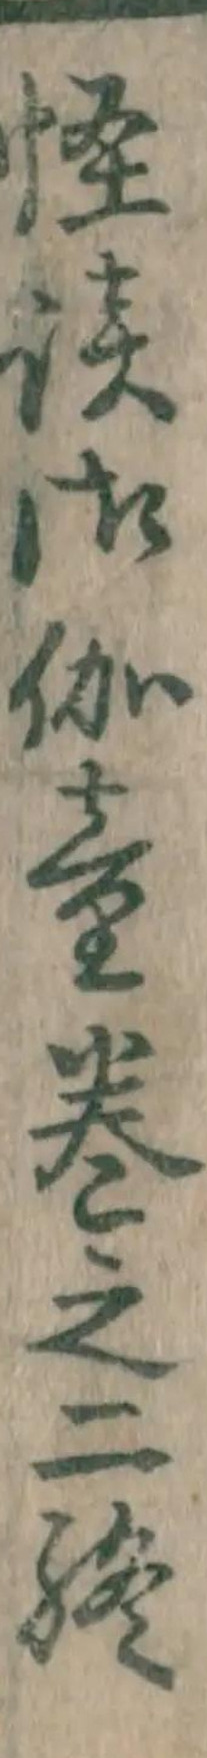怪談御伽童巻之二終
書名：怪談御伽童 5巻. [1]
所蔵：国立国会図書館 National Diet Library, JAPAN
